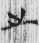之
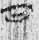日
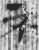不
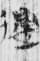歸
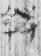登
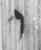人
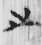之
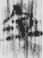金
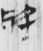阩
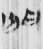門
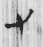又
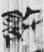敗
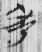秀
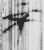不
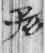孫
